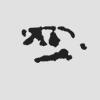亟
